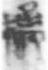○（表）
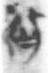紫
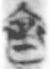裏
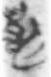○（貂）
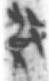○（紛）
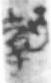韌
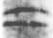二
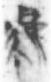綏
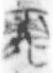彔（綠）
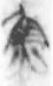魚
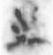之
